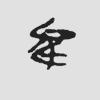夋
